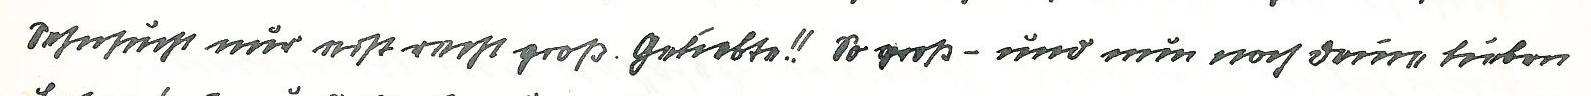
Sehnsucht nur erst recht groß. Geliebte!! So groß – und nun noch Deine lieben
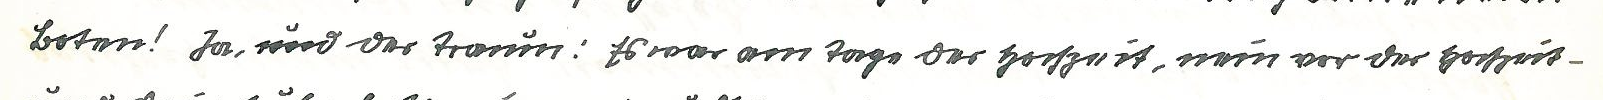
Boten! Ja, und der Traum: Es war am Tage der Hochzeit, nein vor der Hochzeit –
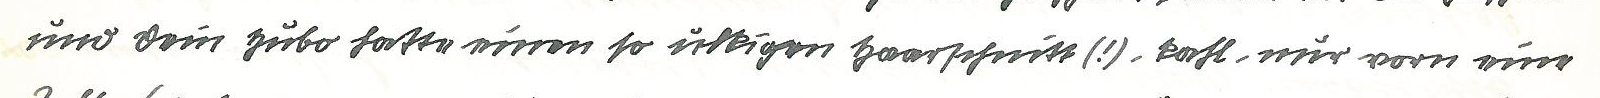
und Dein Hubo hatte einen so ulkigen Haarschnitt (!), kahl, nur vorn eine
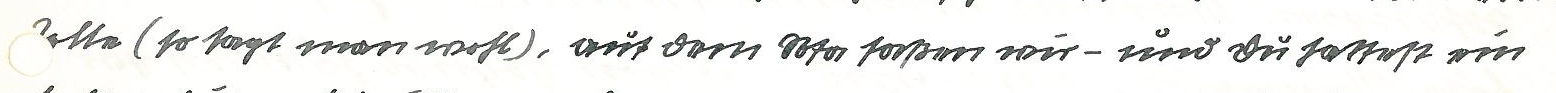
Tolle (so sagt man wohl), auf dem Sofa saßen wir – und Du hattest ein
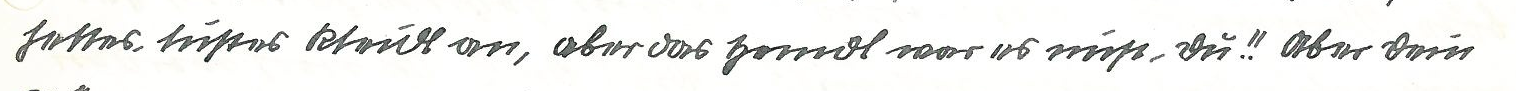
helles, lichtes Kleidl an, aber das Hemdl war es nicht, Du!! Aber Dein
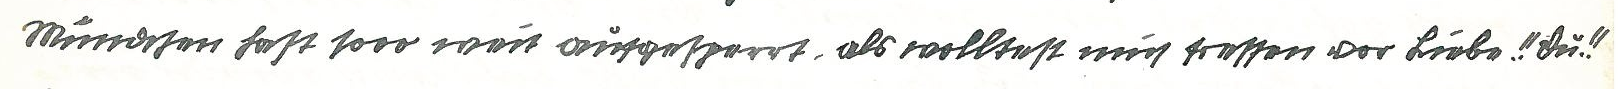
Mündchen hast sooo weit aufgesperrt, als wolltest mich fressen vor Liebe!! Du!!
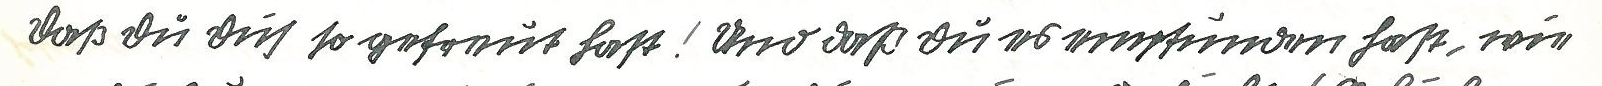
Daß Du Dich so gefreut hast! Und daß Du es empfunden hast, wie
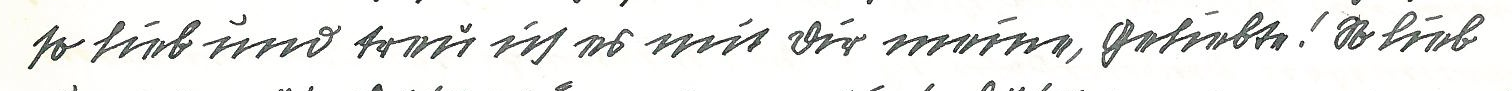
so lieb und treu ich es mit Dir meine, Geliebte! So lieb
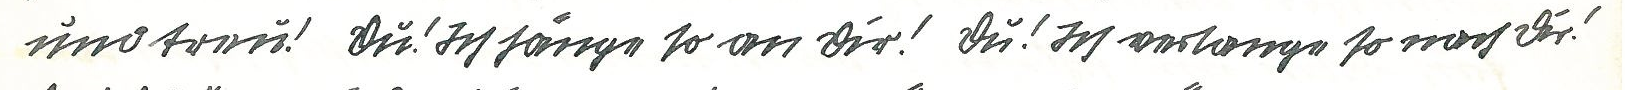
und treu! Du! Ich hänge so an Dir! Du! Ich verlange so nach Dir!
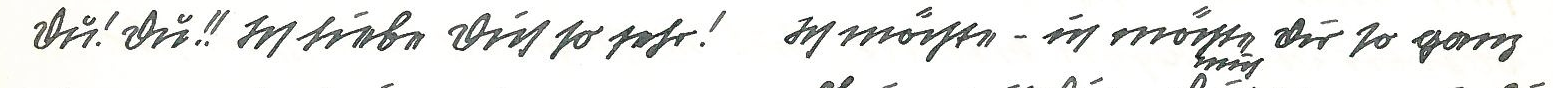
Du! Du!! Ich liebe Dich so sehr! Ich möchte – ich möchte Dir so ganz
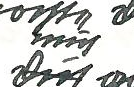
mich
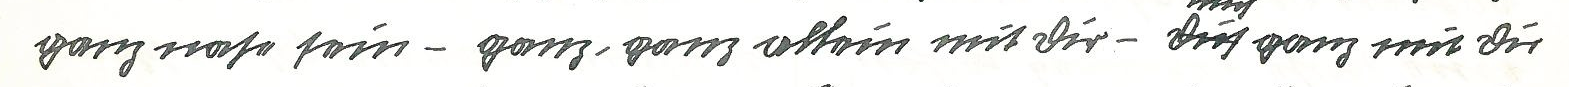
ganz nahe sein – ganz, ganz allein mit Dir – Dich ganz mit Dir
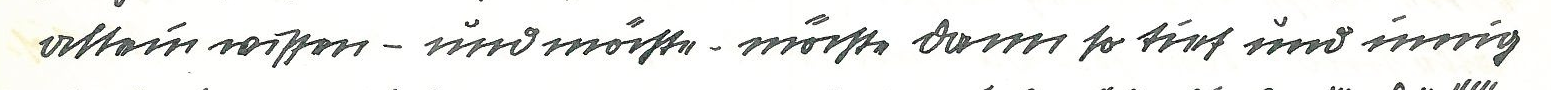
allein wissen – und möchte – möchte dann so tief und innig
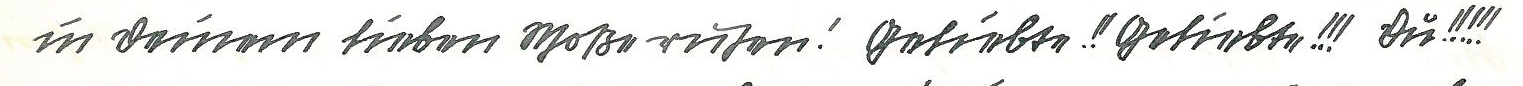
in Deinem lieben Schoße ruhen! Geliebte!! Geliebte!!! Du!!!!!
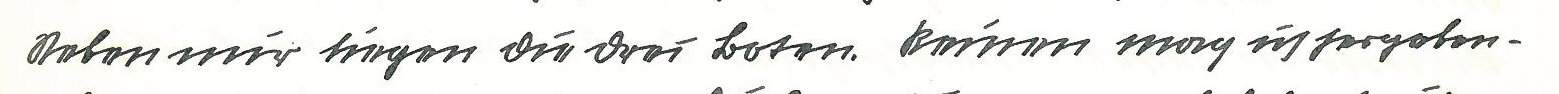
Neben mir liegen die drei Boten. Keinen mag ich hergeben –
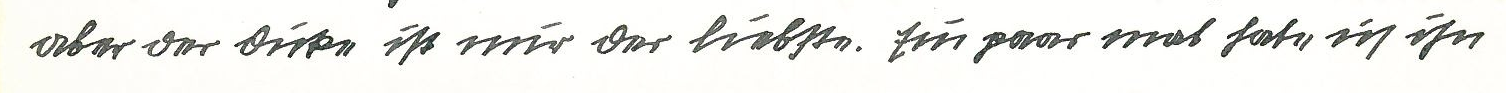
aber der Dicke ist mir der liebste. Ein paar mal habe ich ihn
